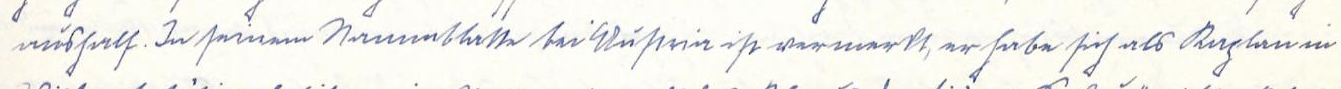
aushalf. In seinen Stammblatte bei Austria ist vermerkt, er habe sich als Kaplan in
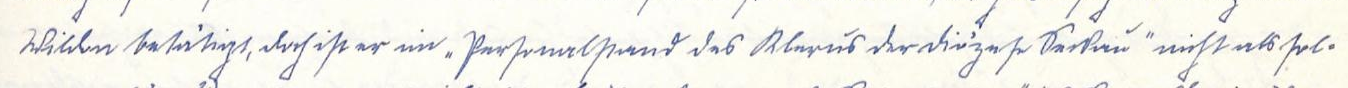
Wilden bestätigt, doch ist er im „Personalstand des Klerus der Diözese Seckau“ nicht als sol-
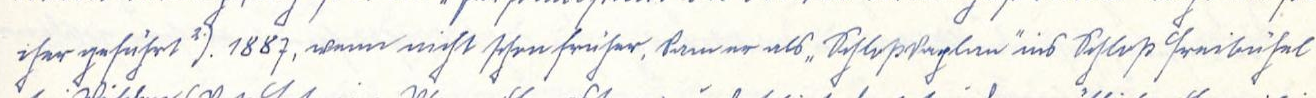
cher geführt 2). 1887, wenn nicht schon früher, kam er als „Schloßkaplan ins Schloß Freibühel
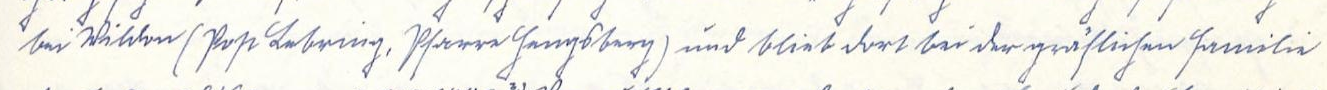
bei Wilden (Post Lebring, Pfarre Hengsberg) und blieb dort bei der gräflichen Familie
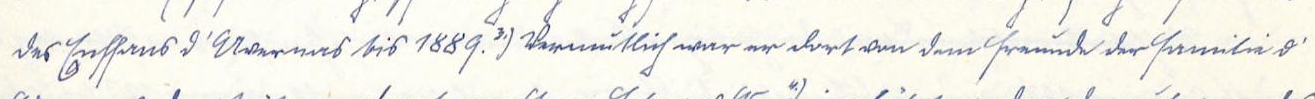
des Enffans d' Avernas bis 1889 3) vermutlich war er dort von dem Freunde der Familie d'
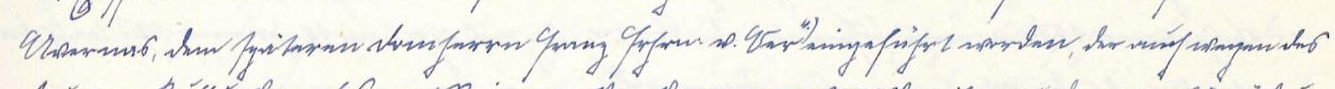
Avernas, dem späteren Domherrn Franz Frhrn. v. Aer 4) eingeführt worden, der auch wegen des
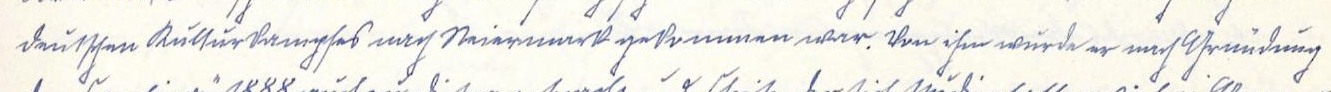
deutschen Kulturkampfes nach Steiermark gekommen war. Von ihm wurde er nach Gründung
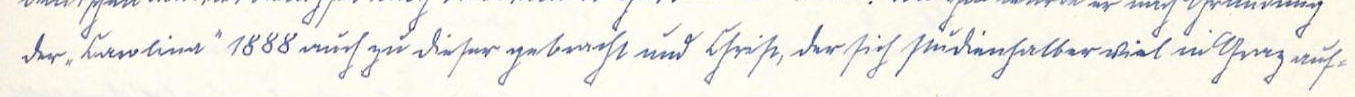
der "Carolina" 1888 auch zu dieser gebracht und Christ, der sich studienhalber viel in Graz auf-
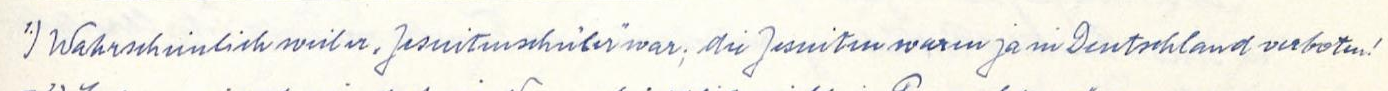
1) Wahrscheinlich weil er Jesuitenschüler war, die Jesuiten waren ja in Deutschland verboten!
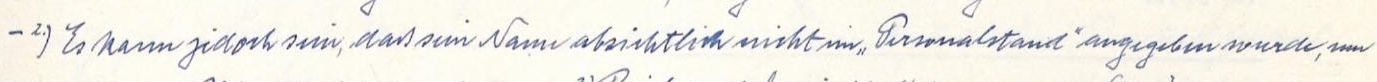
2) Es kann jedoch sein, daß sein Name absichtlich nicht im „Personalstand" angegeben wurde, um
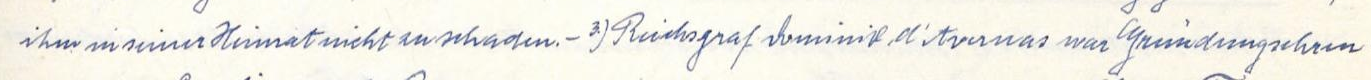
ihm in seiner Heimat nicht zu schaden. - 3) Reichsgraf Dominik d' Avernas s war Gründungsehren-
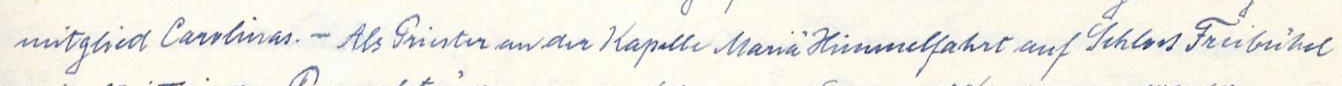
Mitglied Carolinas.- Als Priester an der Kapelle Maria HImmelfahrt auf Schloß Freibühel
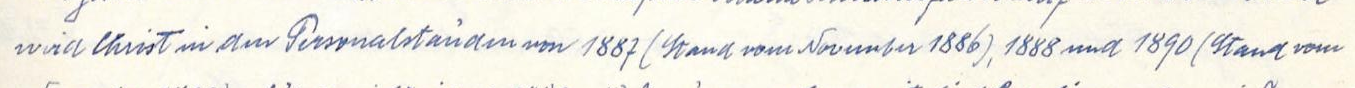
wird Christ in den Personalständen von 1887 (Stand von November 1886) 1888 und 1890 (Stand von
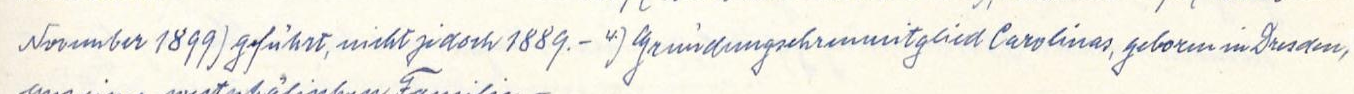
November 1899) geführt, nicht jedoch 1889.- 25) Gründungsehreneitglied Carolinas, geboren in Dresden,
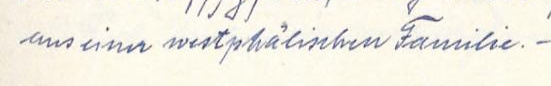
aus einer westphälischen Familie.-
